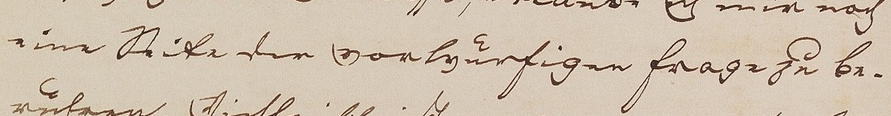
eine Seite der vorwürfigen Frage zu be-
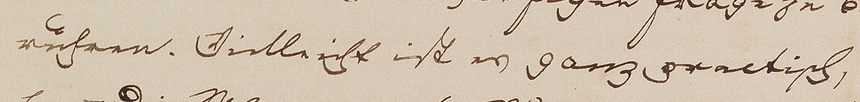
rühren. Vielleicht ist es ganz practisch,
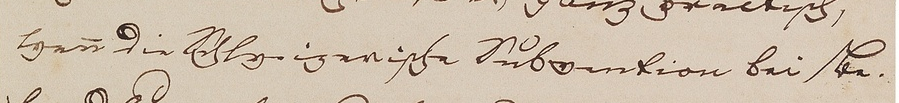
wenn die Schweizerische Subvention bei Be-
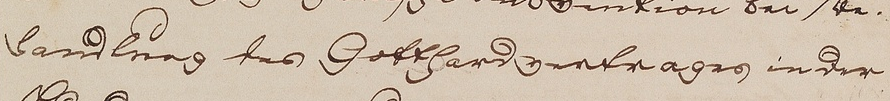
handlung des Gotthardvertrages in der
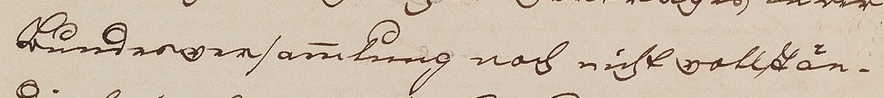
Bundesversammlung noch nicht vollstän-
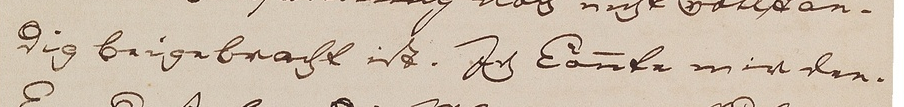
dig beigebracht ist. Ich könnte mir den-
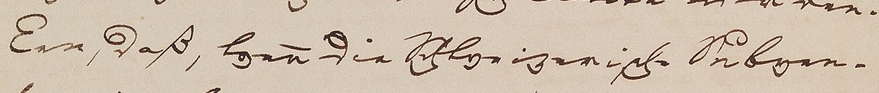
ken, daß, wenn die Schweizerische Subven-
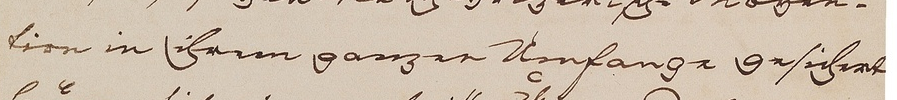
tion in ihrem ganzen Umfange gesichert
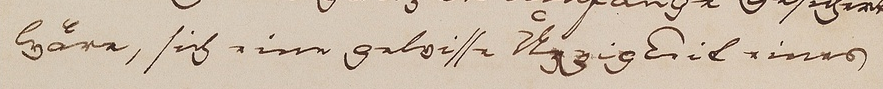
wäre, sich eine gewisse Üppigkeit eines
